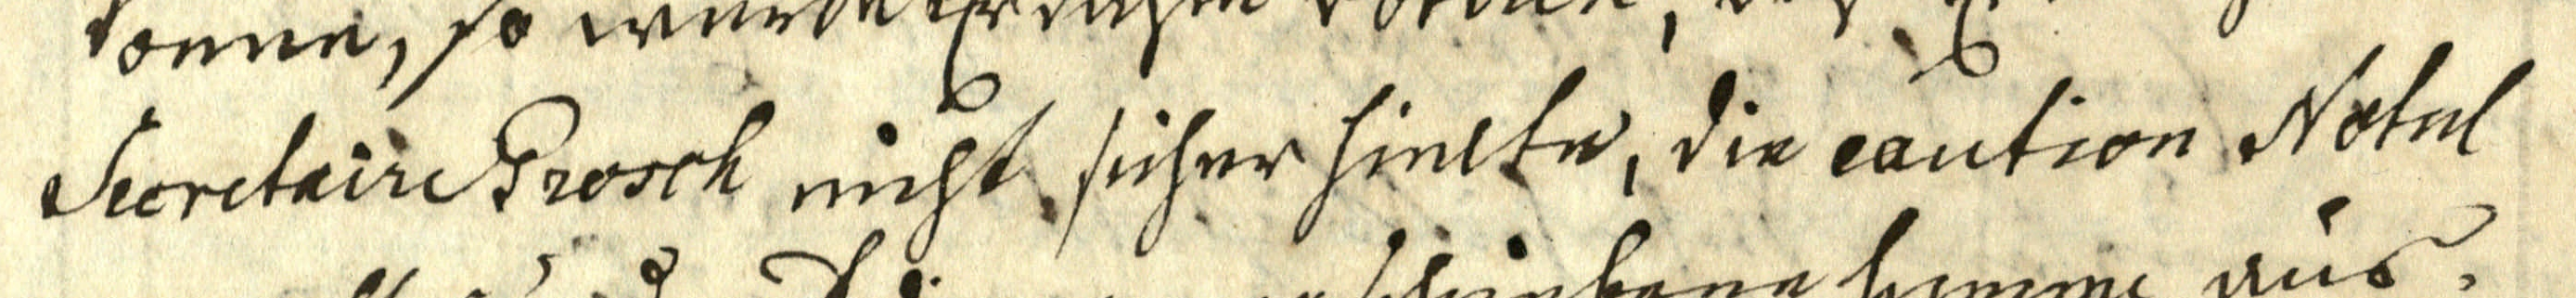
Secretaire Grosch nicht sicher hielte, die Caution Notul
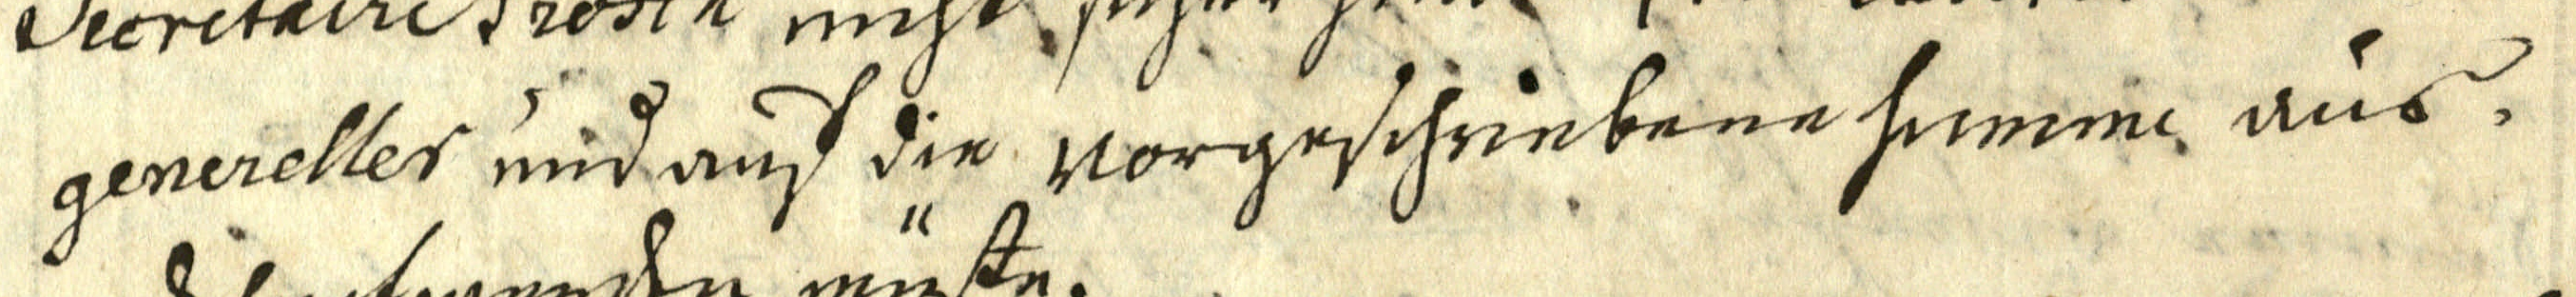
genereller und auf die vorgeschriebene Summe aus¬
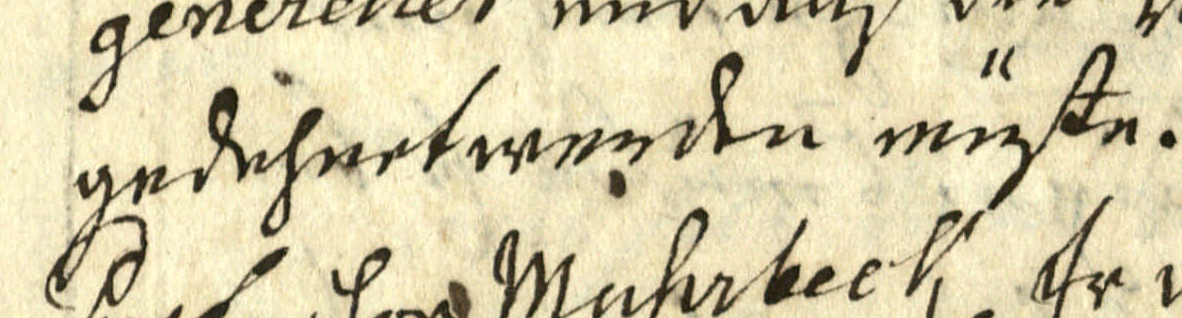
gedehnet werden müste.
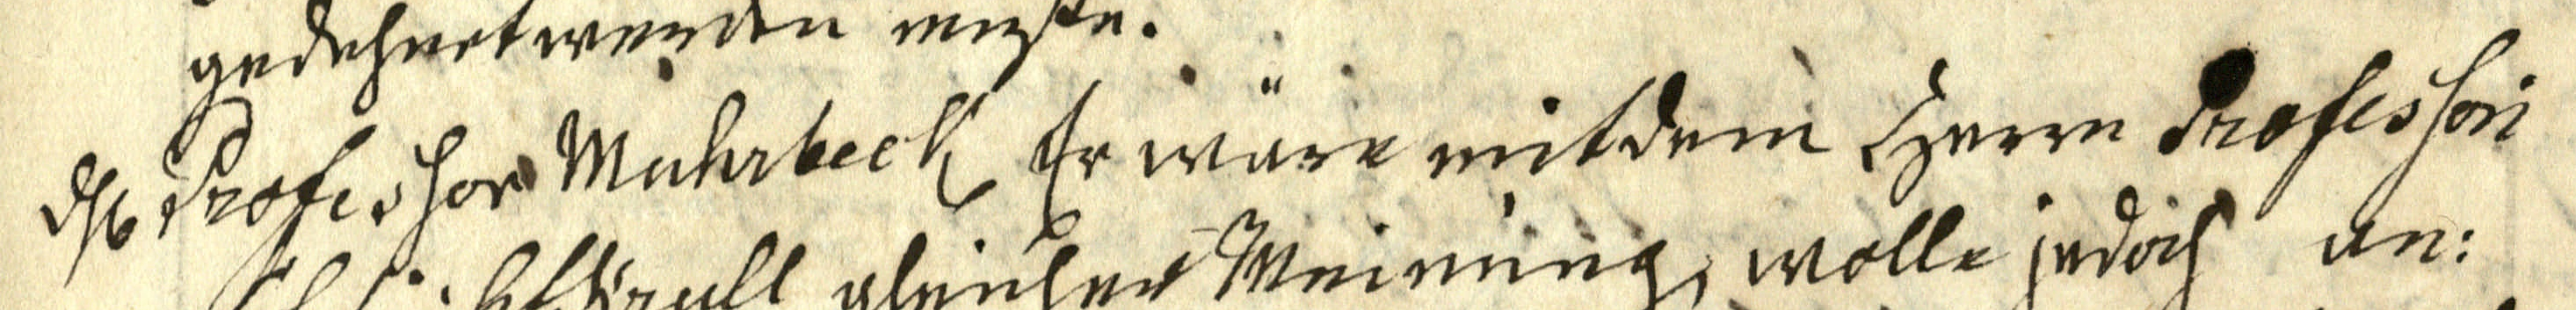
dh Professor Muhrbeck. Er wäre mit dem Herrn Professor
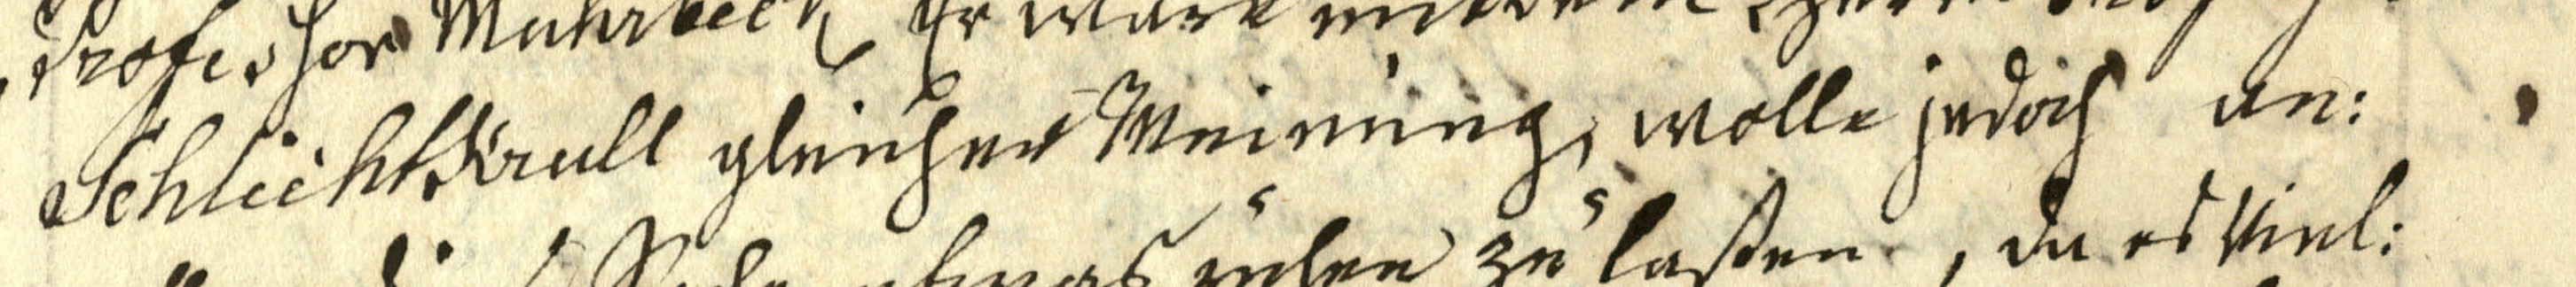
Schlichtkrull gleicher Meinung, wolle jedoch an¬
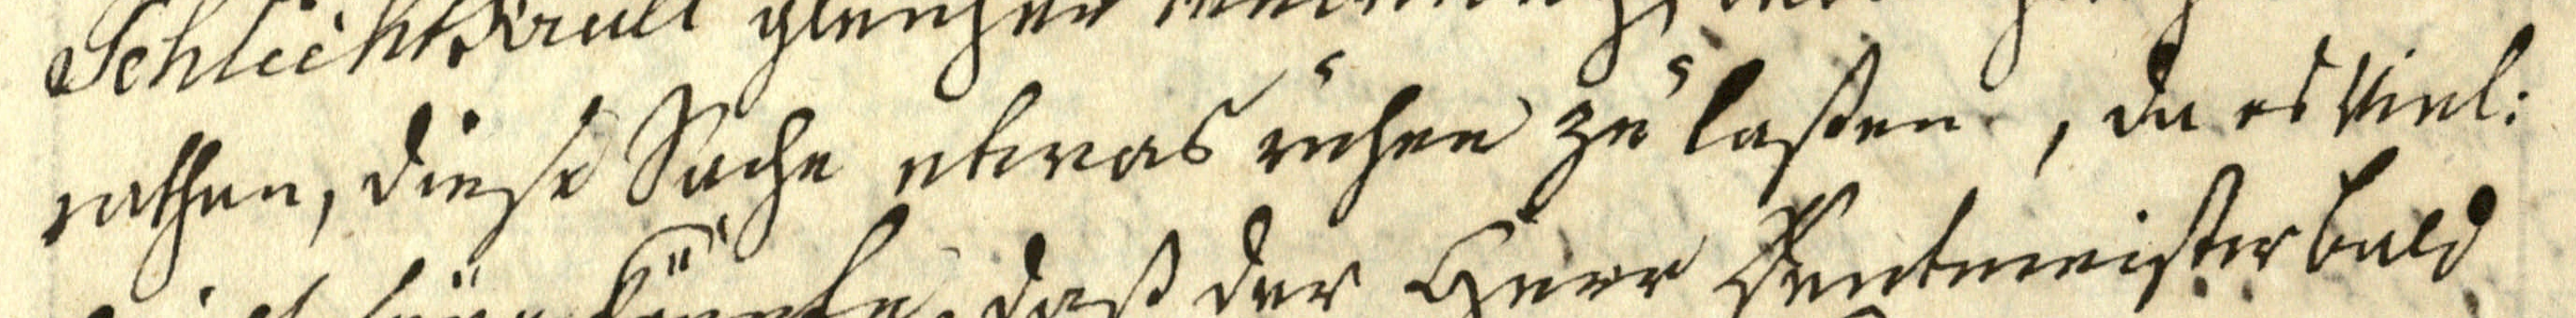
rathen, diese Sache etwas reichen zu laßen, da es viel¬
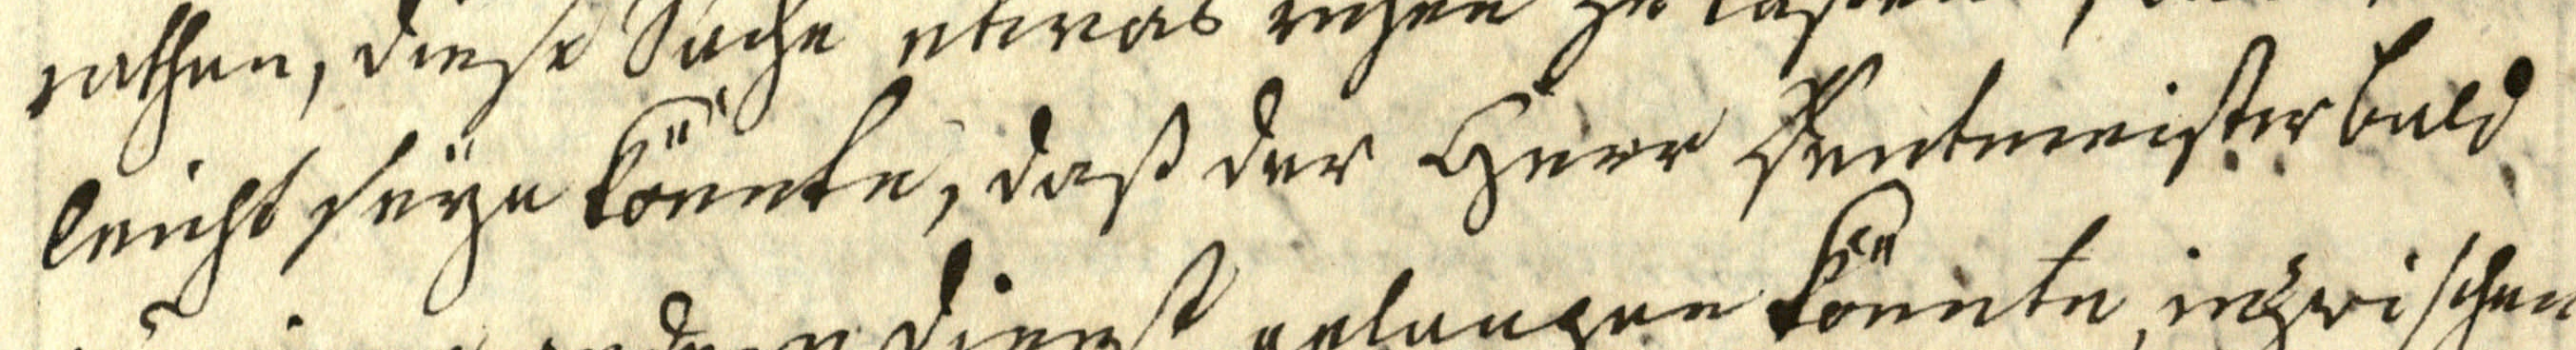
leicht seÿn könnte, daß der Herr Rentmeister bald
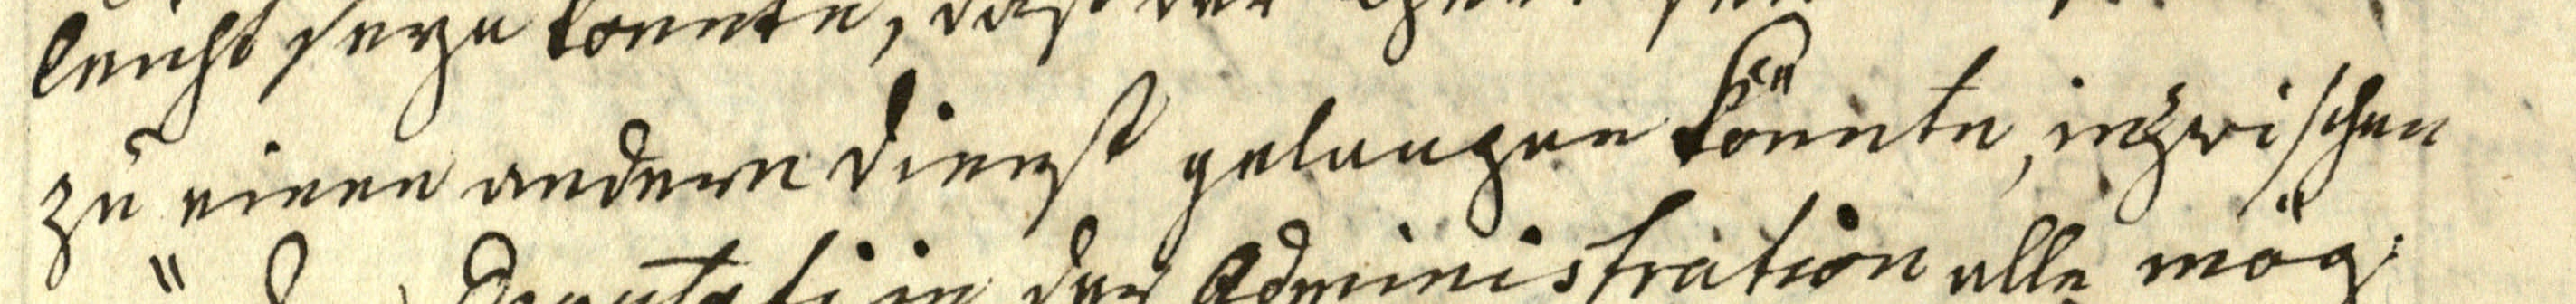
zu einen andern Dienst gelangen könnte, inzwischen
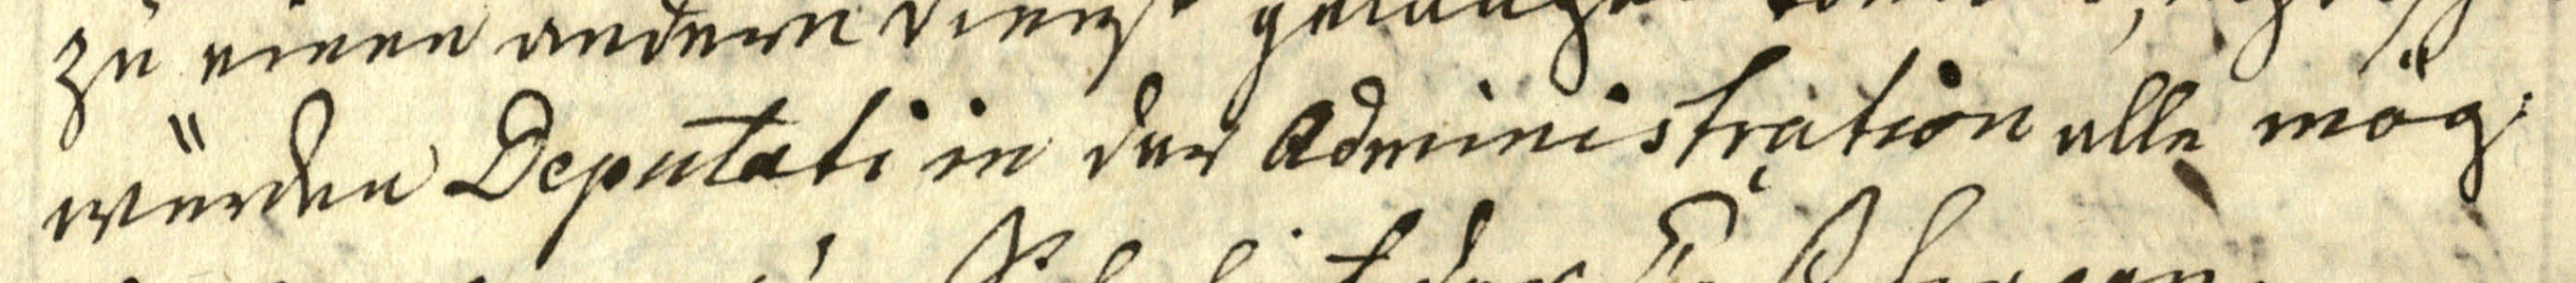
würden Deputati in der Administration alle mög¬
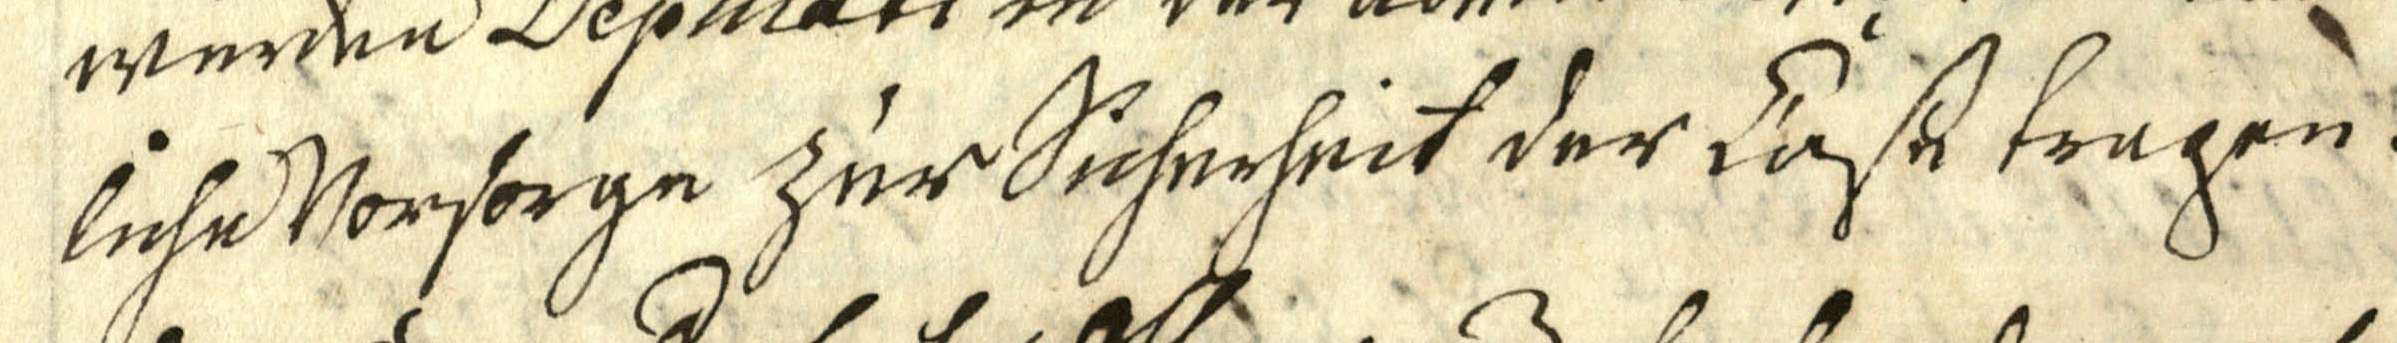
liche Vorsorge zur Sicherheit der Caße tragen.
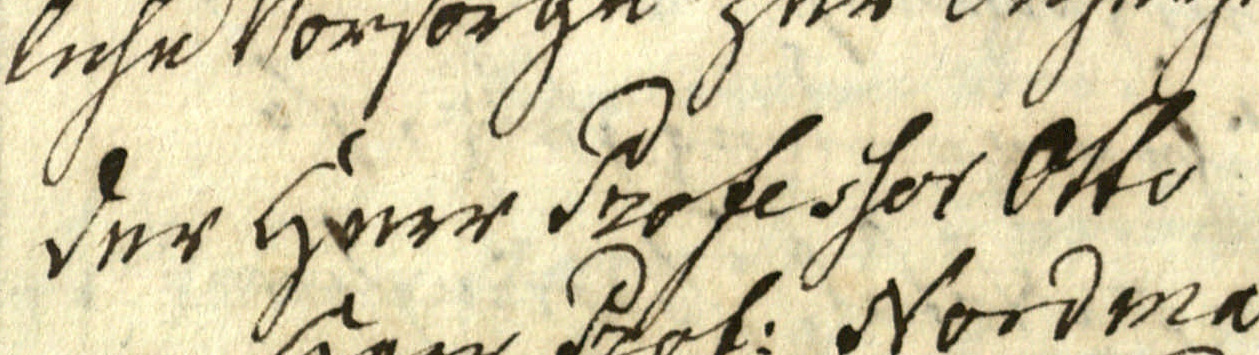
der Herr Professor Otto
